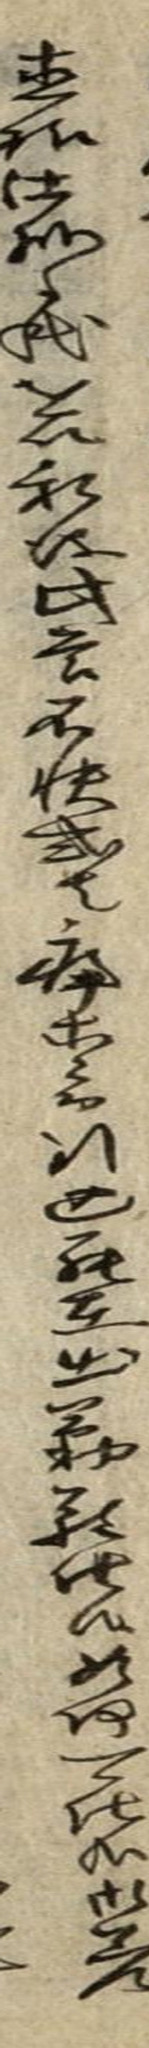直様仕掛手紙を以私儀此節不快或は痛等に而引込罷在出勤難仕候如何可仕候哉御差
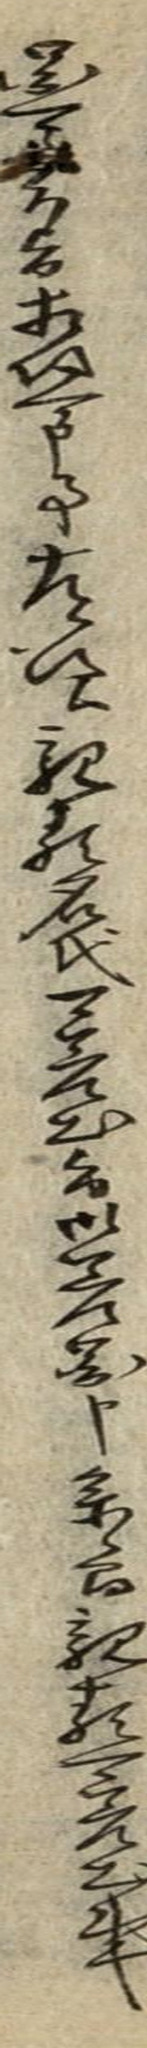図可被下旨相伺可申事左候得は親類名代可差出旨御差図申参候間親類可差出事
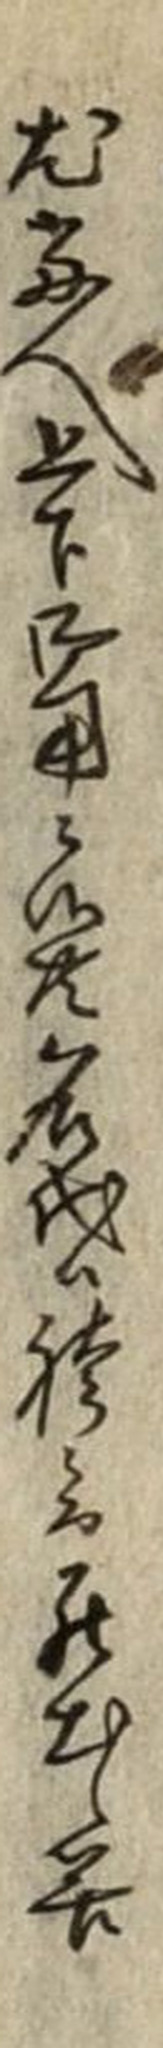尤当人上下御用に候共名代は袴に而罷出候筈
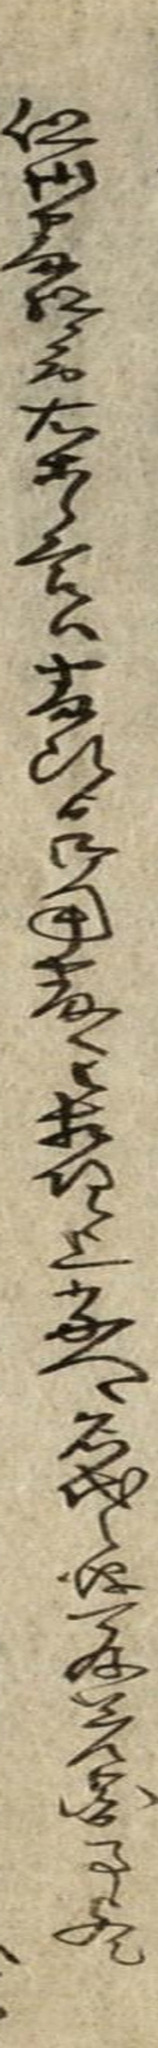但御番組に而右等之節は番頭ゟ御用番へ被相伺候上当人へ名代之儀可及差図事歟
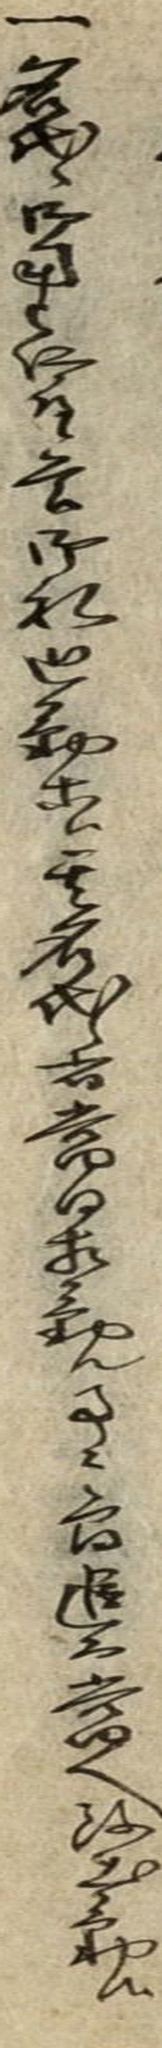一名代へ御用被仰付候節御礼廻勤等は其名代之者当日相勤ル事に候間追而当人致出勤候
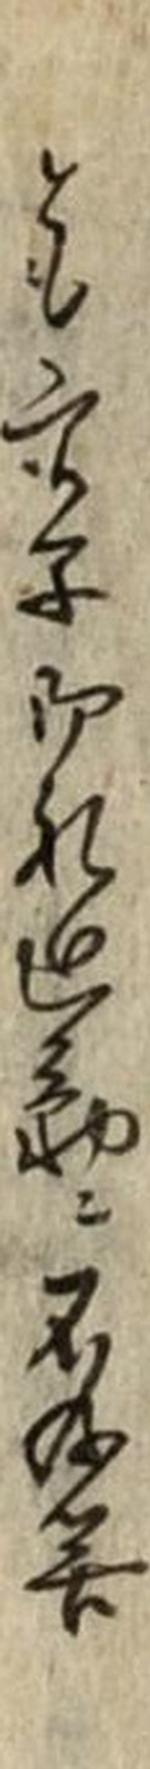とも最早御礼廻勤に不及筈
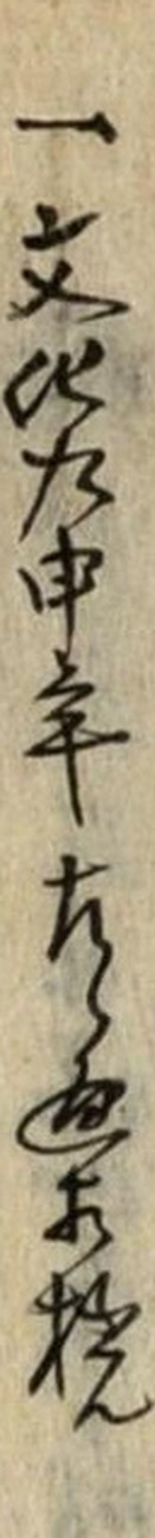一文化九申年左之通相極ル
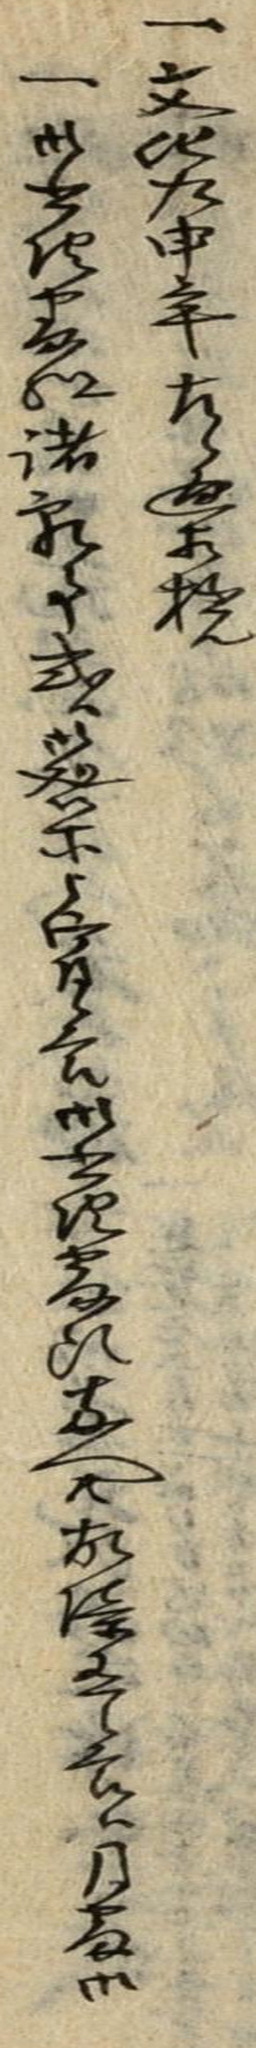一御書院番組諸願事或は御咎等被仰付候節御書院番頭両人共故障有之節は月番御
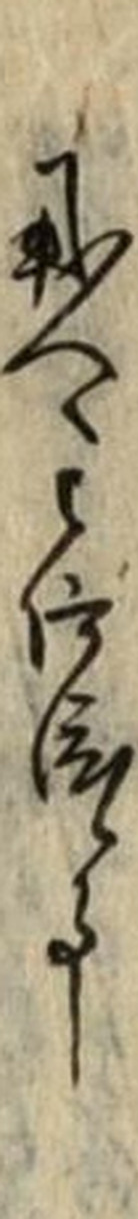用人へ被仰渡候事
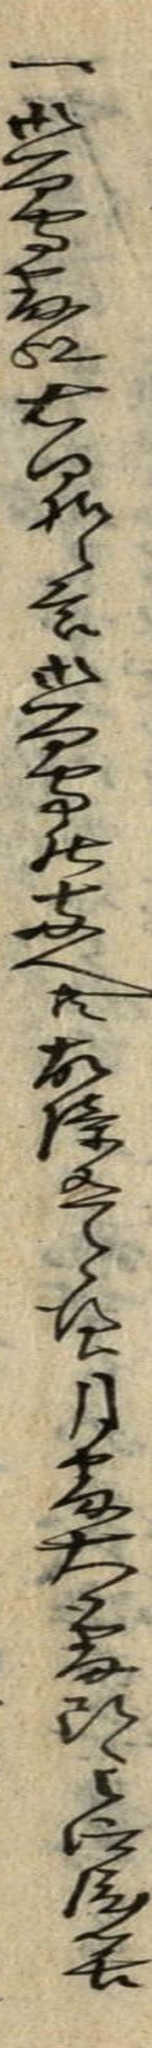一御留守番組右同断之節御留守居両人共故障有之候得は月番大番頭へ被仰渡筈
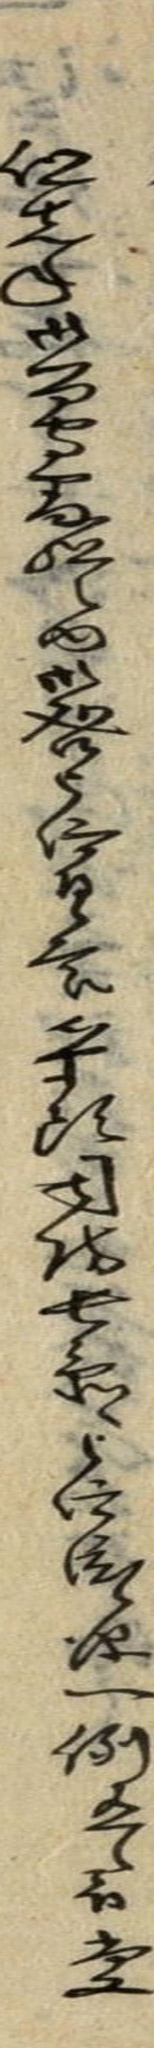但先年御留守番組之内御咎被仰付候節筆頭周防長兵衛へ被仰渡候儀一例有之に付尚又
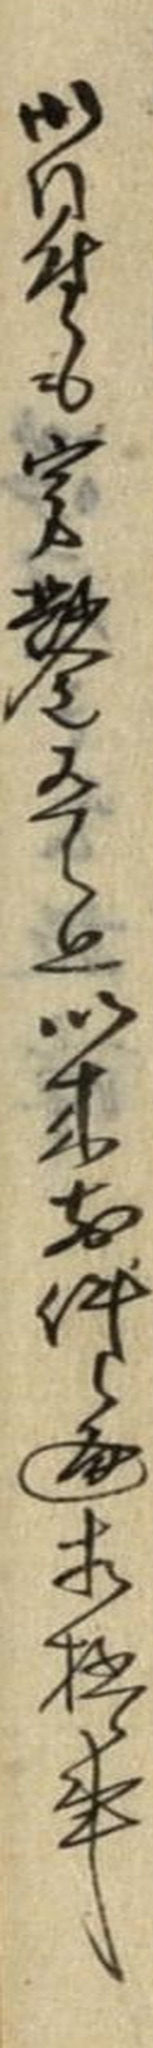御目付へも穿鑿有之候上以来前件之通相極候事
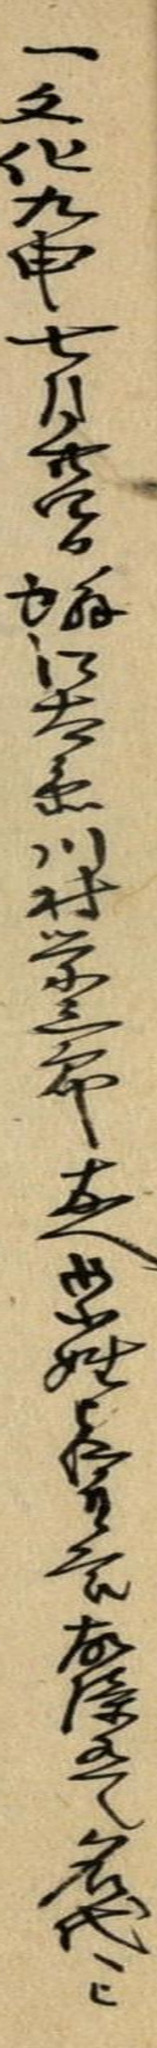一文化九申七月廿四日蟹江太兵衛川村栄三郎両人御小姓被仰付候節故障有之名代へ被
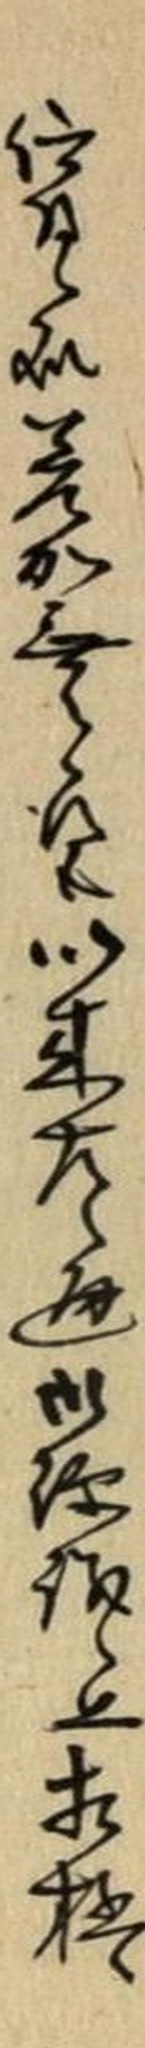仰付候処差加無之候得共以来左之通御評議之上相極候
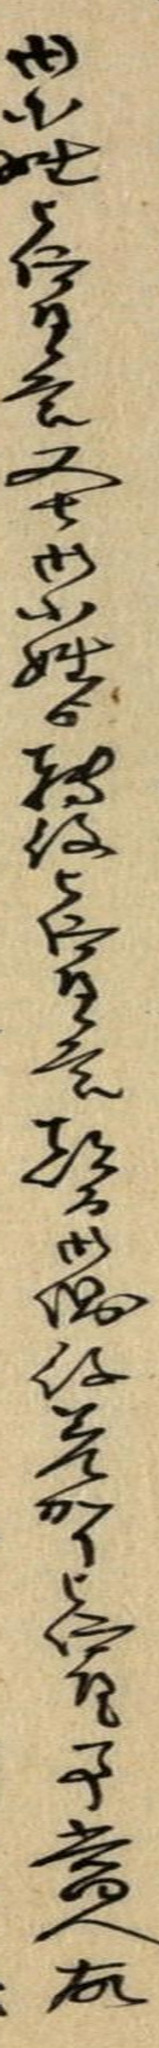御小姓被仰付候節又は御小姓ゟ転役被仰付候節都而御側役差加り被仰付候事当人故
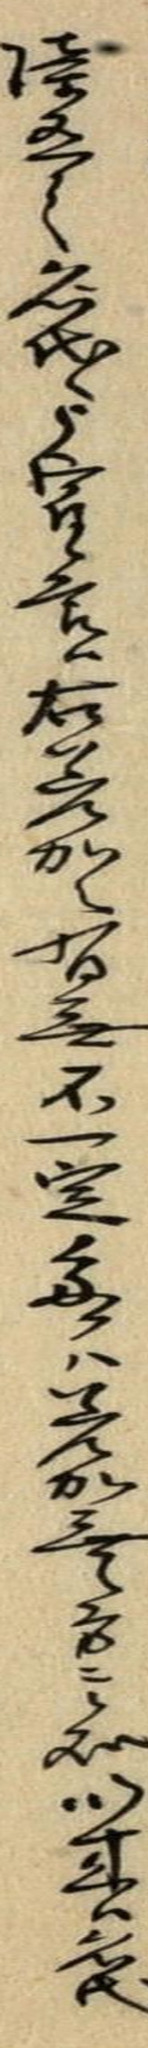障有之名代へ被仰付候節は右差加之有無不一定多くは差加無之方に候処以来は名代
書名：御用并被仰出之部
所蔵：福井県文書館 Fukui Prefectural Archives
